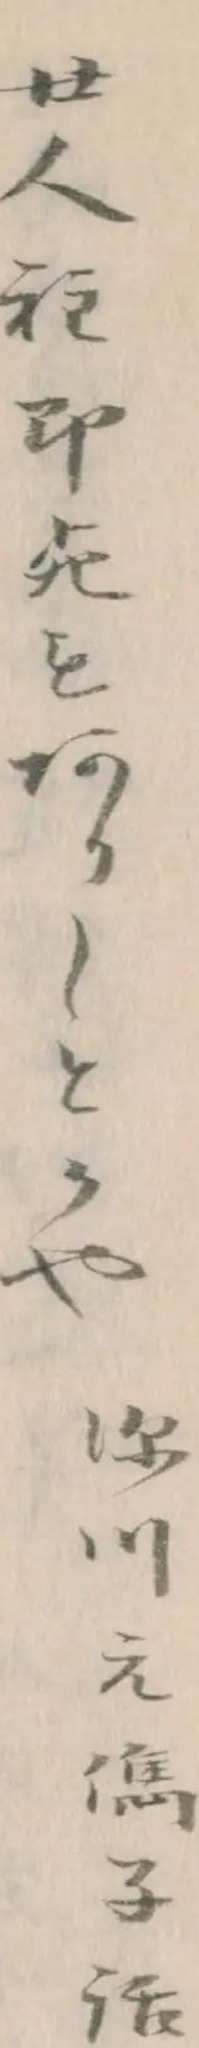廿人程即死もありしとかや深川元儁子話
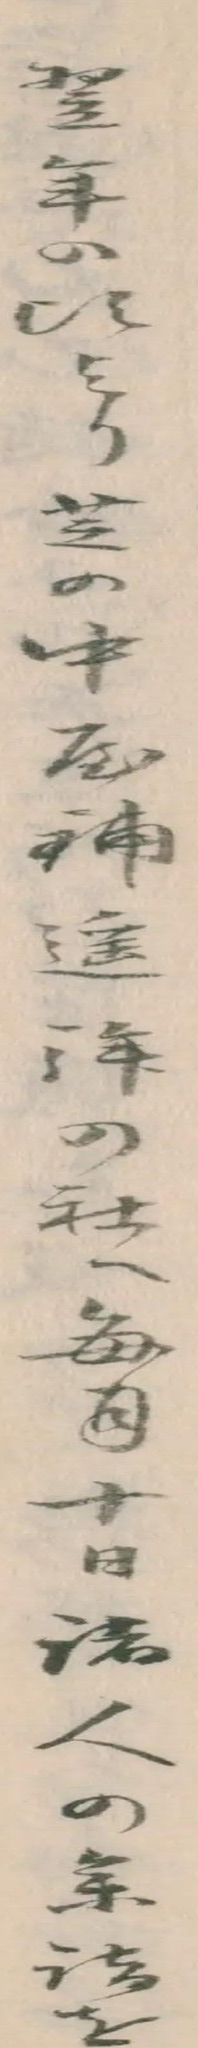翌年の頃より芝の中屋鋪遥拝の社へ毎月十日諸人の参詣を
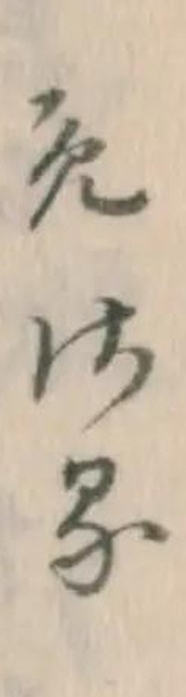免さる
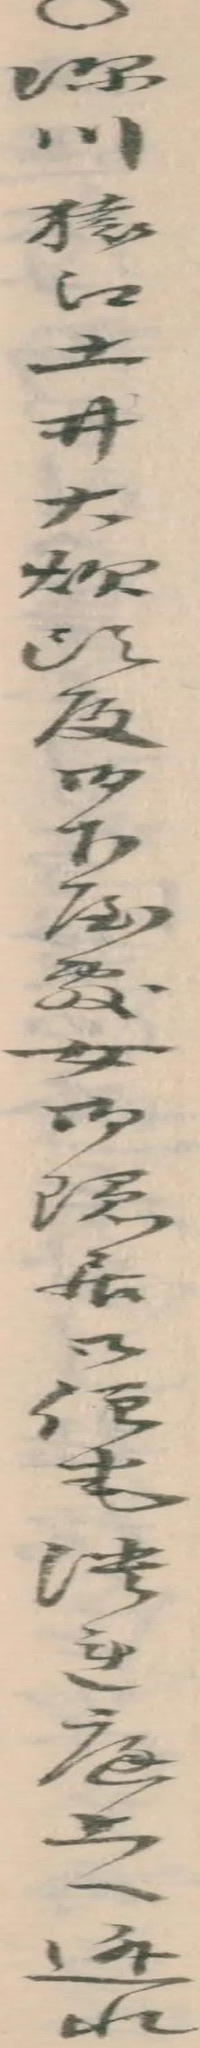〇深川猿江土井大炊頭殿御下屋敷女御隠居御住宅潰れ庭上へ逃れ
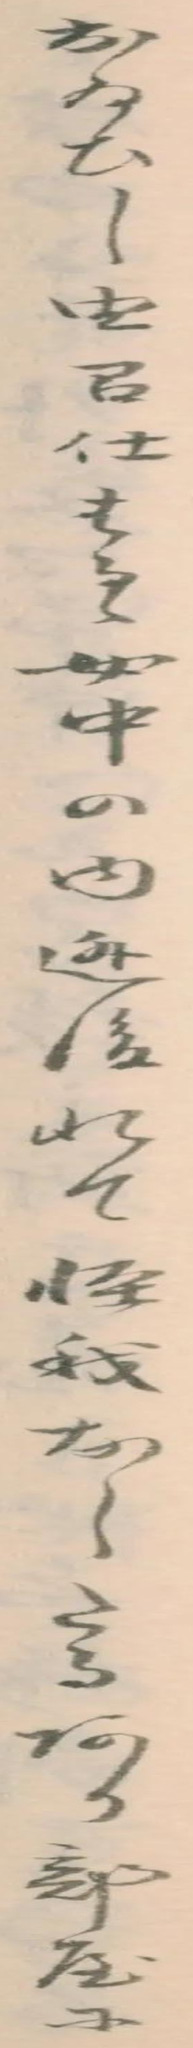出給ひし由召仕はるゝ女中の内逃後れて怪我なしたるあり部屋に
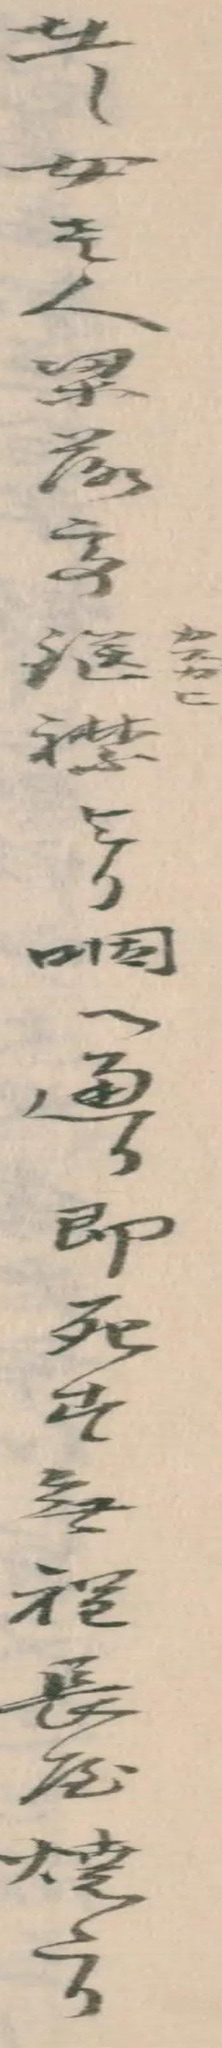在し女壱人梁落て鎹襟より咽へ通り即死す無程長屋焼たり
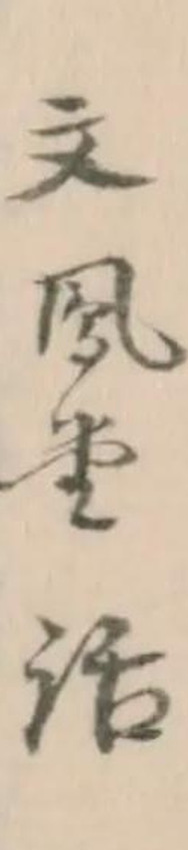文鳳堂話
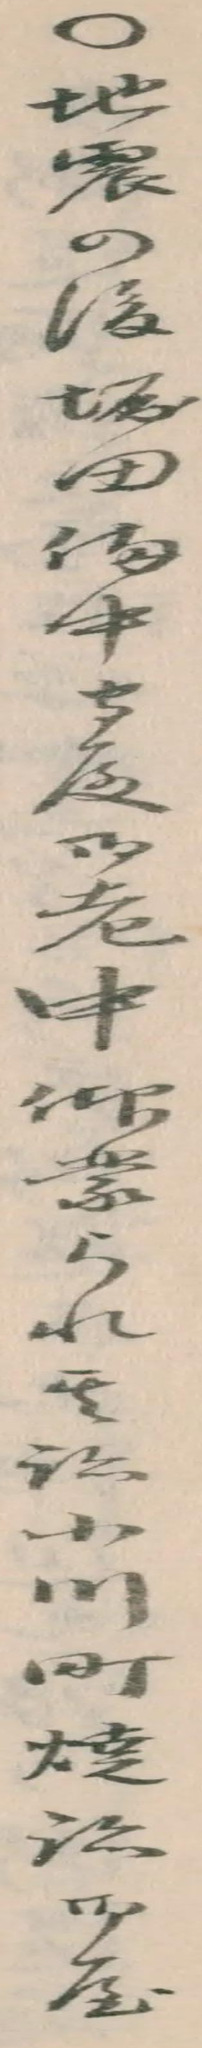〇地震の後堀田備中守殿御老中仰蒙られ其跡小川町焼跡御屋
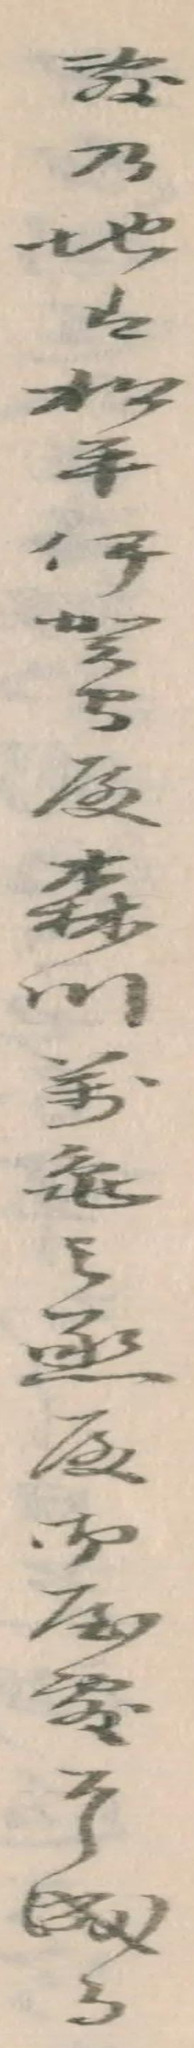敷の地は松平伊賀守殿森川万亀之丞殿御屋敷に成る
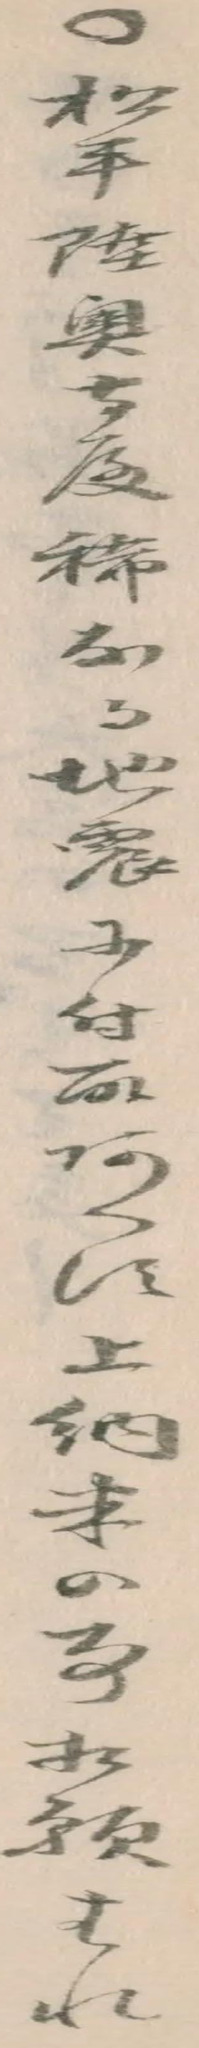〇松平陸奥守殿稀なる地震に付取あへす上納米の事相願はれ
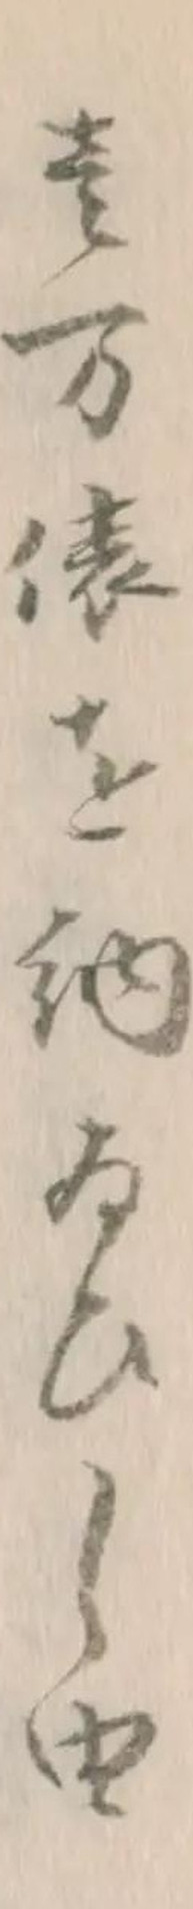壱万俵を納給ひし由
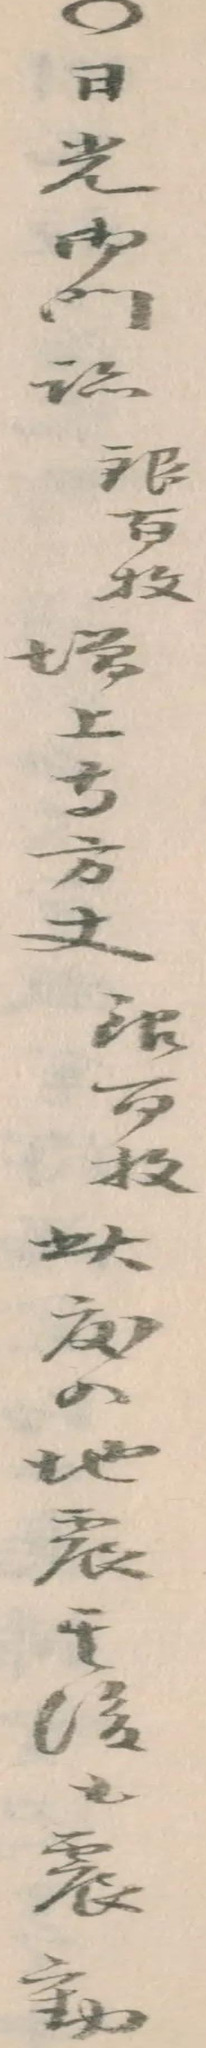日光御門跡銀百枚増上寺方丈銀百枚此度の地震其後も振動
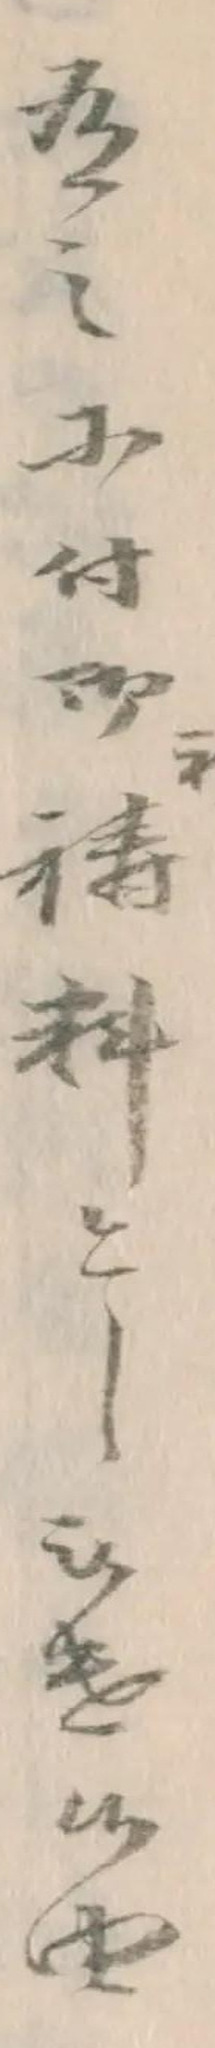有之に付御祈祷料とし被遣候由

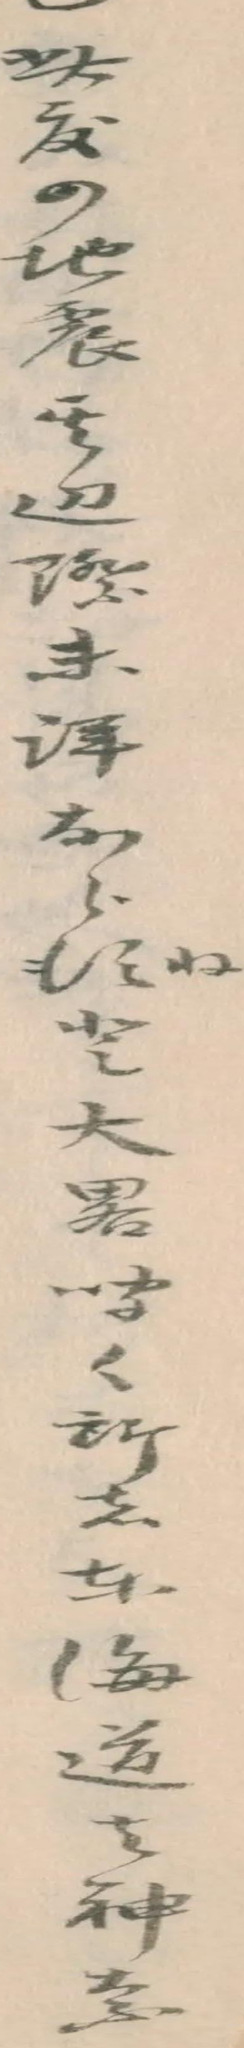〇此度の地震其辺際未詳ならすと大略聞く所は東海道は神奈
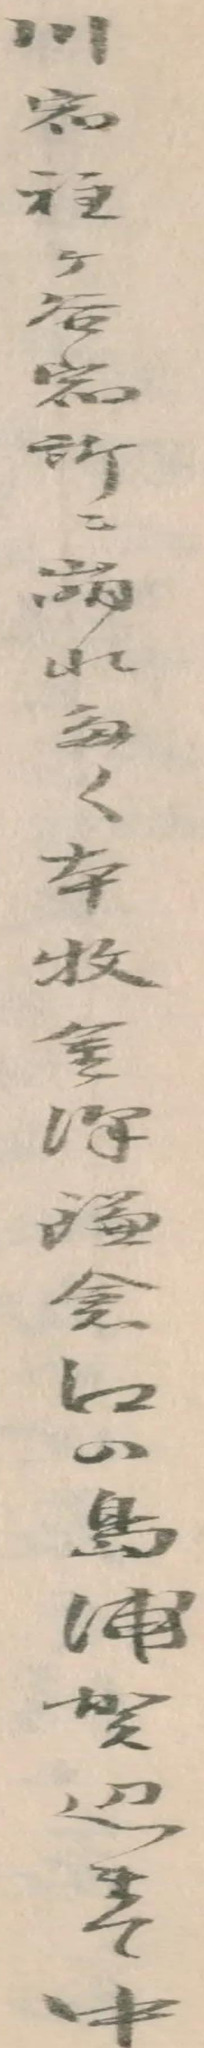川宿程ヶ谷宿所に崩れ多く本牧金沢鎌倉江の島浦賀辺まて中
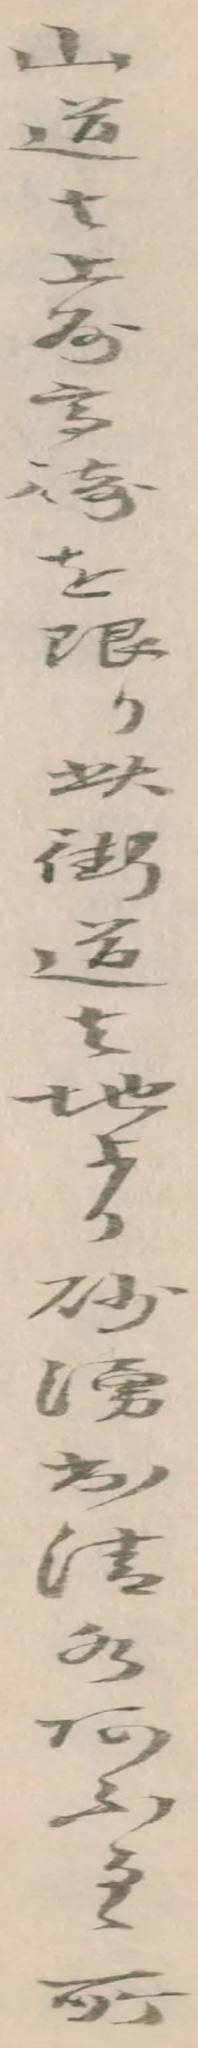山道は上州高崎を限り此街道は地より砂湧出清水あふるゝ所
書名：地災撮要. 巻10(地震之部) 上,下
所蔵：国立国会図書館 National Diet Library, JAPAN
